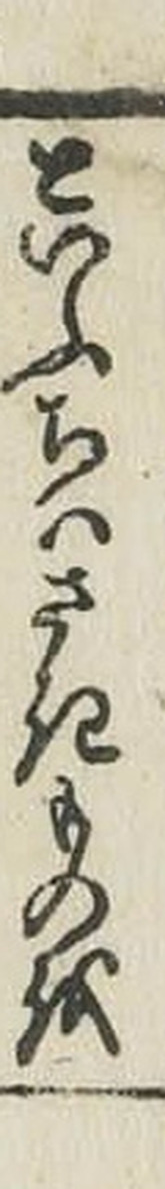といふちいさきものを
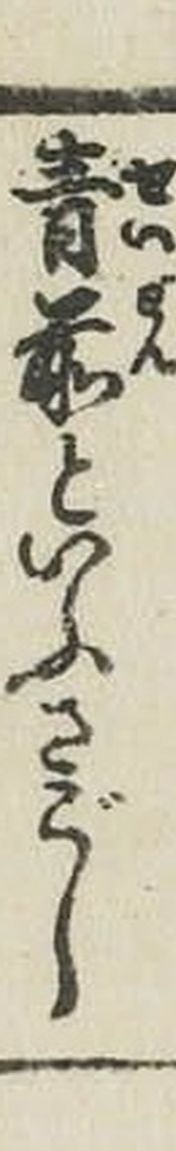青前といふさごし
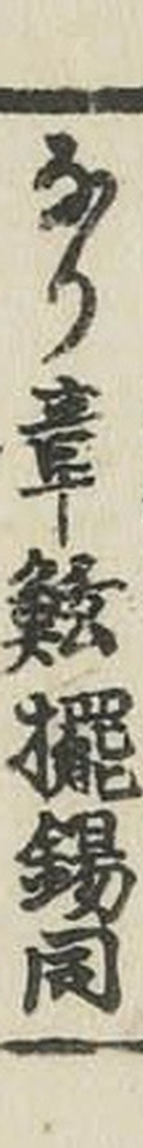なり章鮌擺錫同
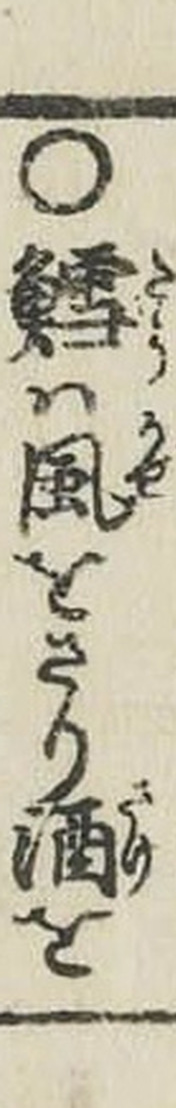○鱈は風をさり酒を
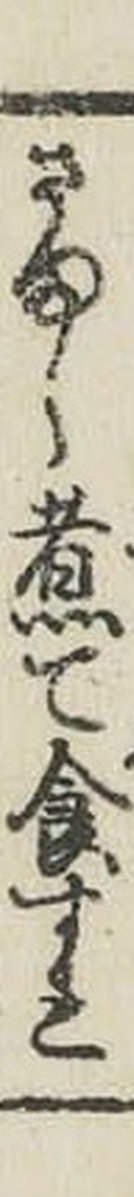さまし煮て食すれ
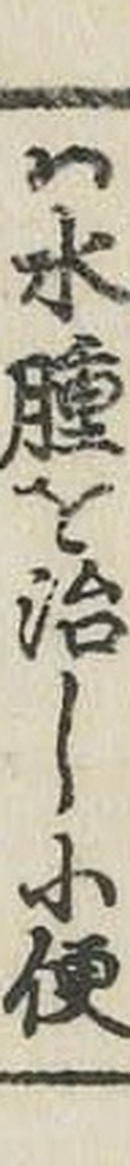は水腫を治し小便
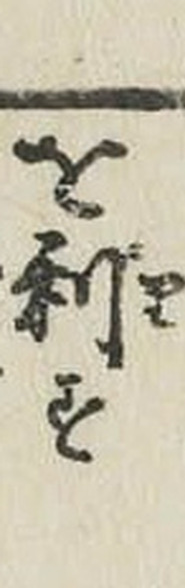を利す
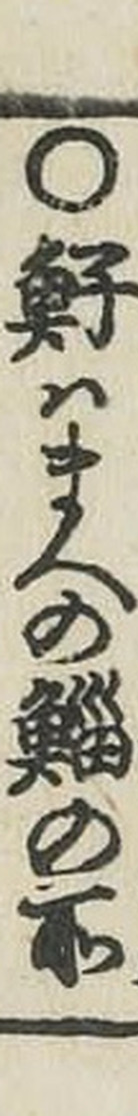○䰵はまへの鯔の所
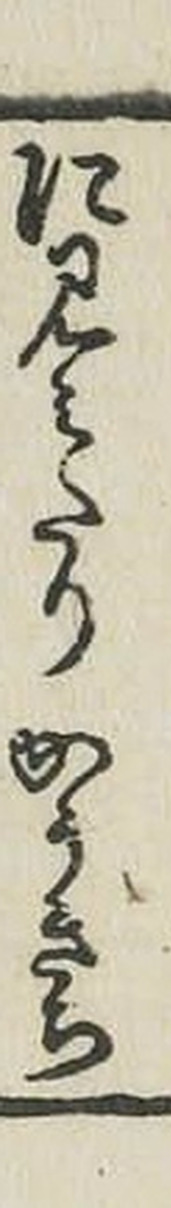に見みたりかうきち
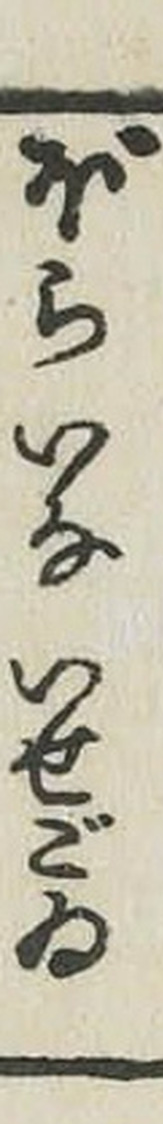ぼらいないせごゐ
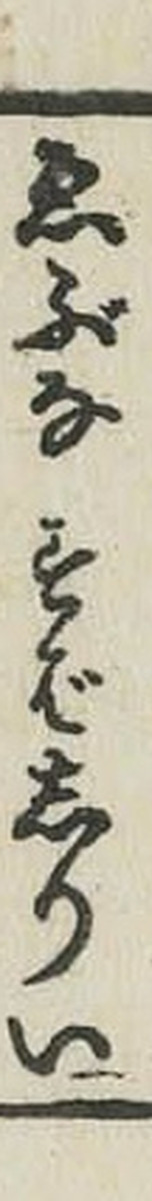ゑぶなすばしりい
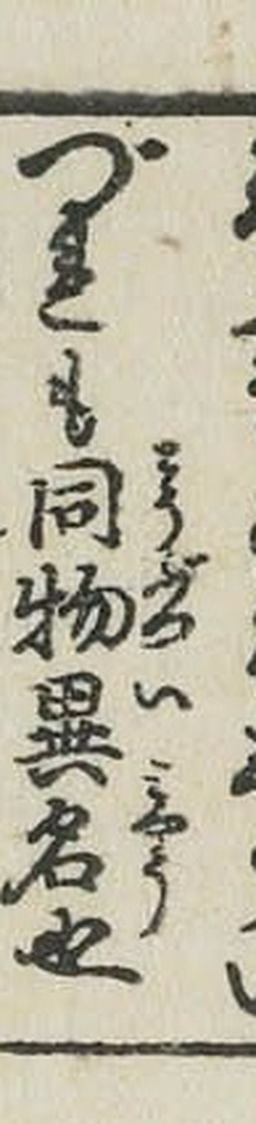づれも同物異名也
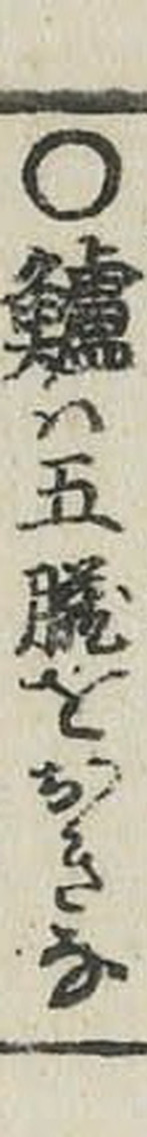○鱸は五臓をおきな
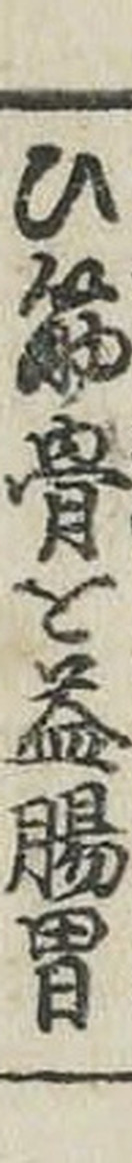ひ筋骨を益腸胃

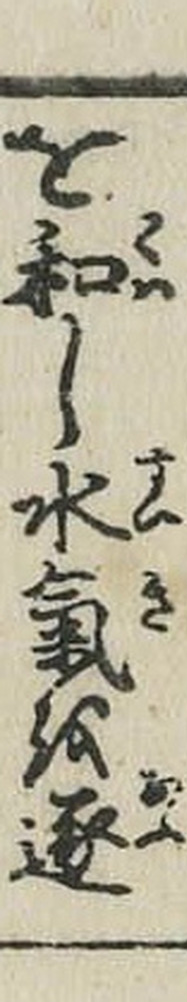を和し水気を逐
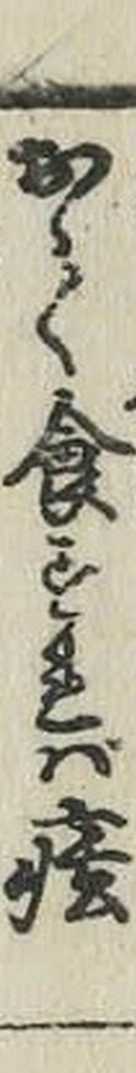おゝく食すれば痃
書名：増補頭書訓蒙図彙大成 10巻 7:巻之14-16
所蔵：東京学芸大学教育コンテンツアーカイブ
